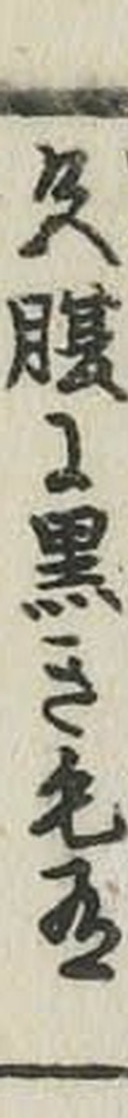色腹に黒き毛有
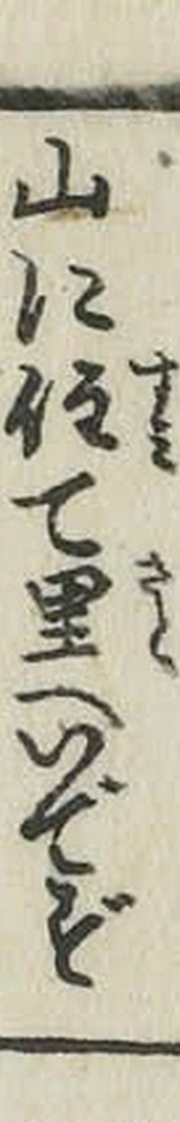山に住て里へいでず
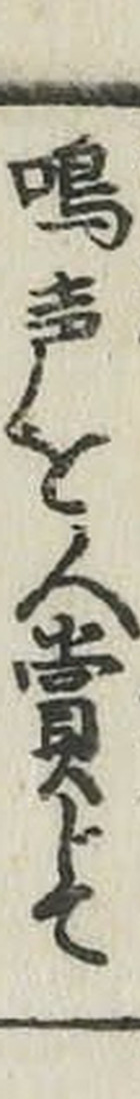鳴声を人賞じて
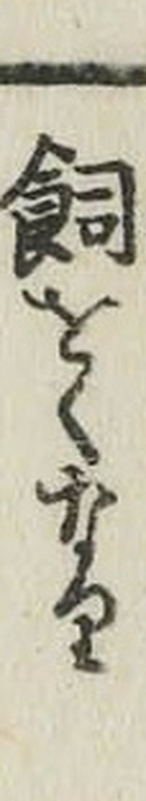飼をくなり
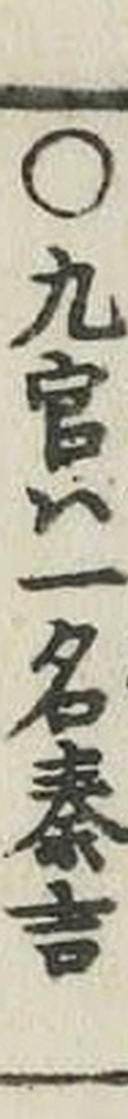○九官は一名秦吉
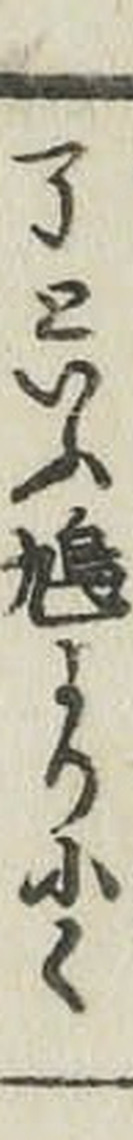了といふ鳩より小く
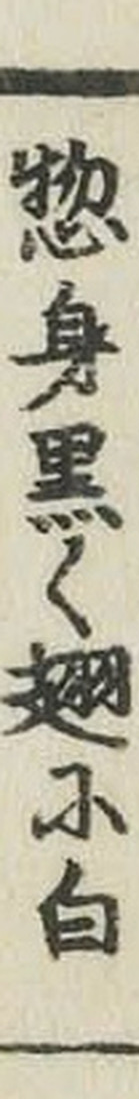惣身黒く翅に白
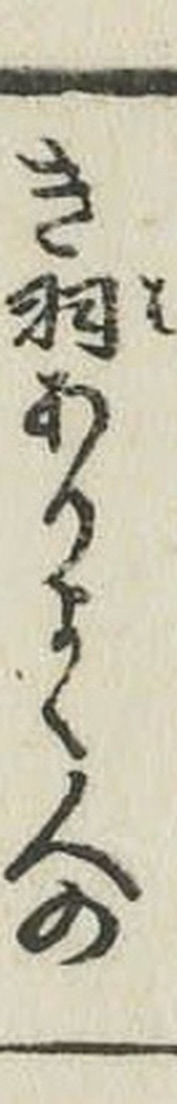き羽ありよく人の
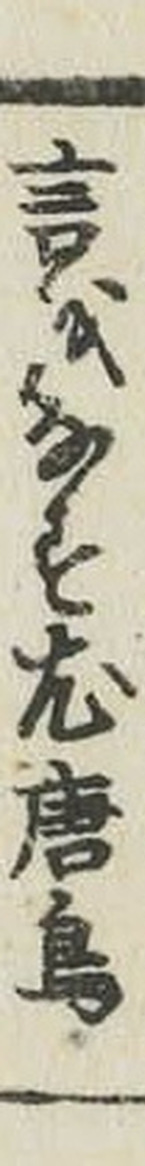言をなす尤唐鳥
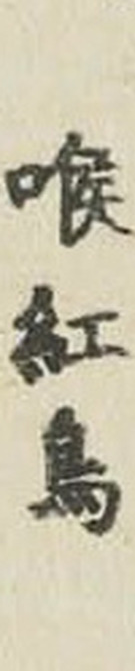喉紅鳥
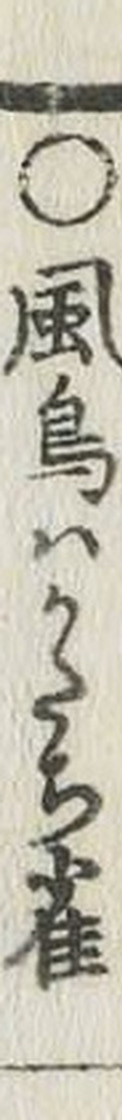○風鳥はかたち雀
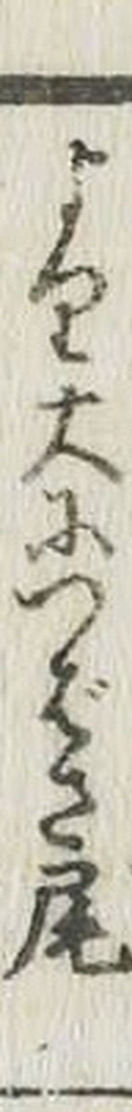より大につばさ尾
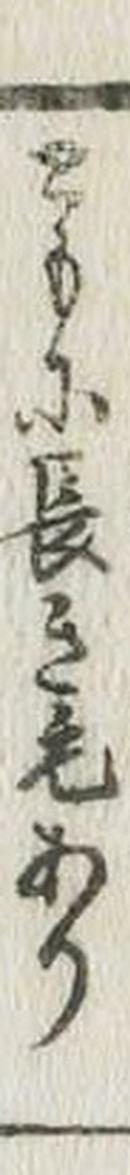ともに長き毛あり
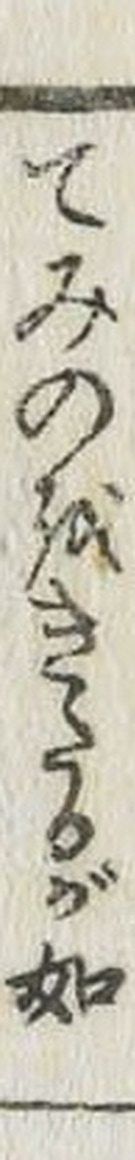てみのをきたるが如
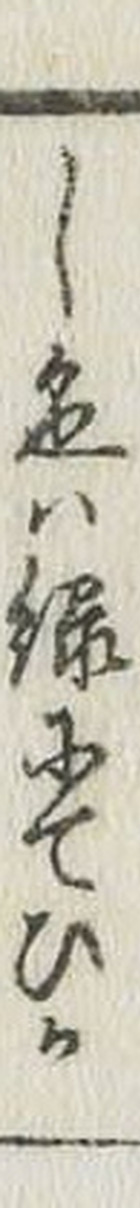し色は緑にてひか
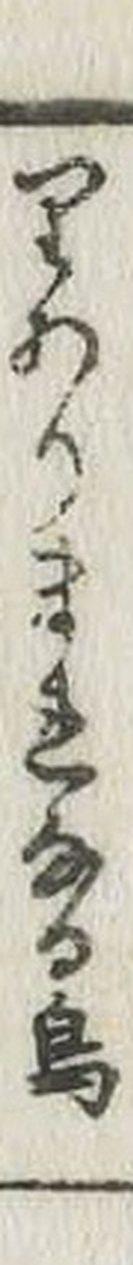りありまれなる鳥
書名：増補頭書訓蒙図彙大成 10巻 6:巻之12-13
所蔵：東京学芸大学教育コンテンツアーカイブ
